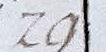29
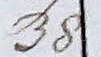38
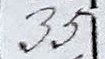35
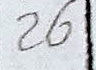26
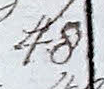48
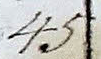45
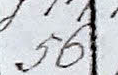56
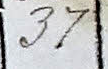37
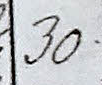30
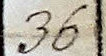36
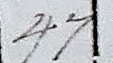47
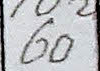60
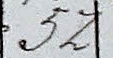52
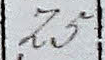25
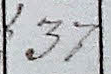37
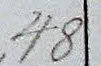48
